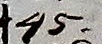45
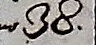38.
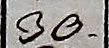30
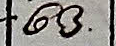63.
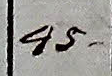45
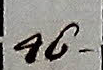46
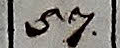57.
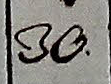30.
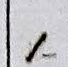1
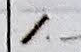1.
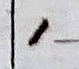1
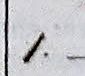1.
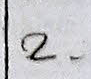2
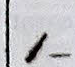1
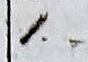1.
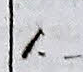1.
